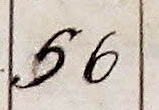56
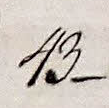43
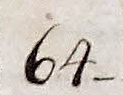64
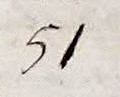51
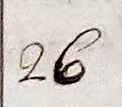26
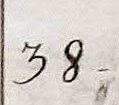38
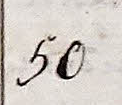50
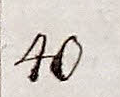40
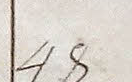48
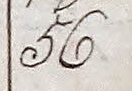56
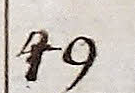49
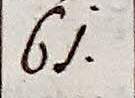61.
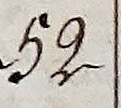52
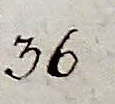36
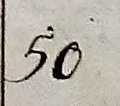50
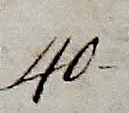40
